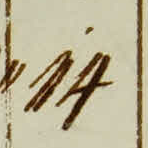14
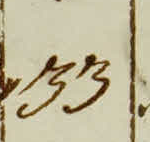33
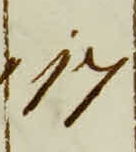17
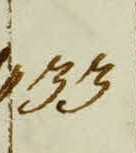33
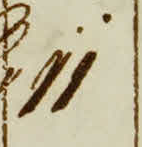11
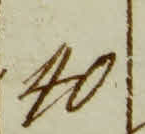40
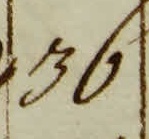36
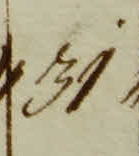31
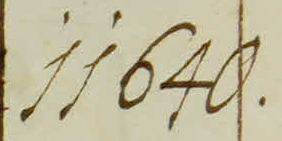11640
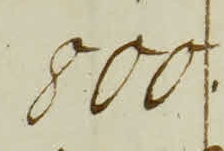800
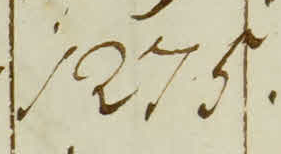1275
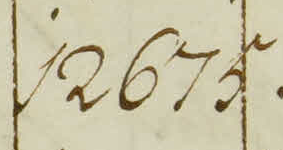12675
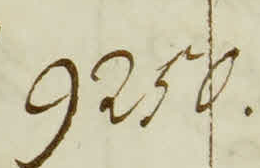9250
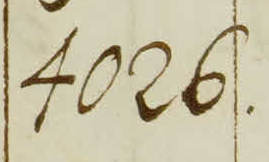4026
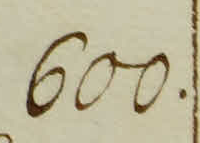600
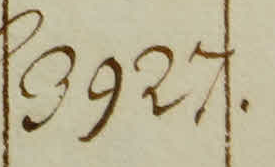3927.
